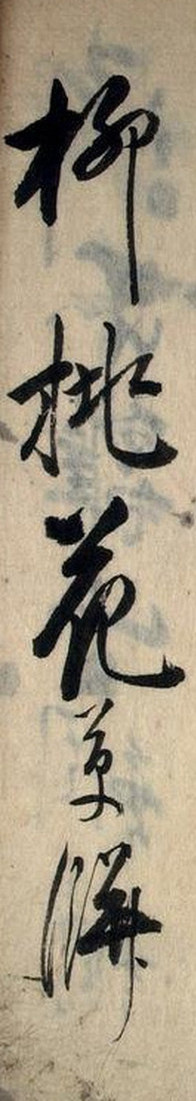柳桃花草餅

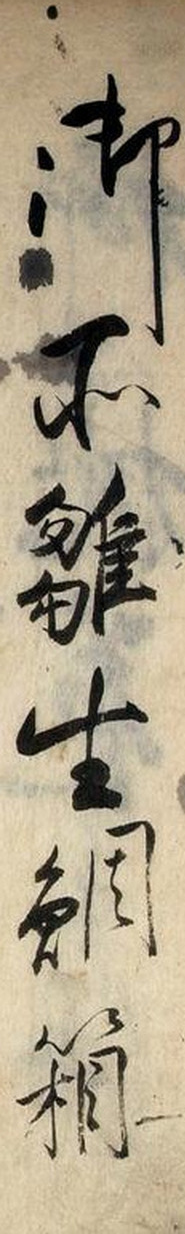御所雛生鯛箱
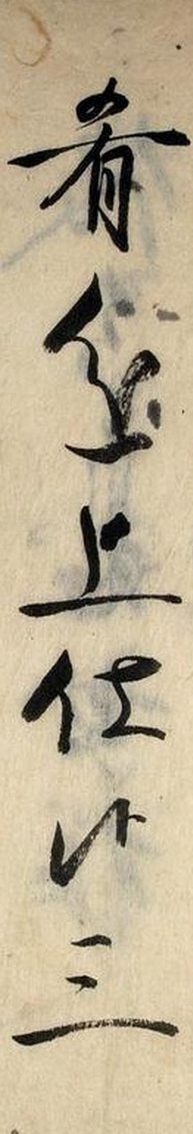肴進上仕候三
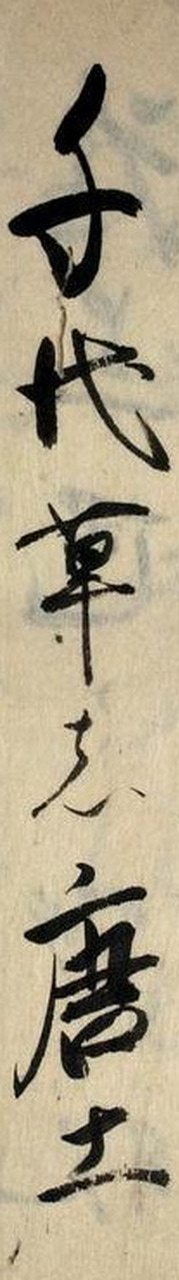千代草は唐土
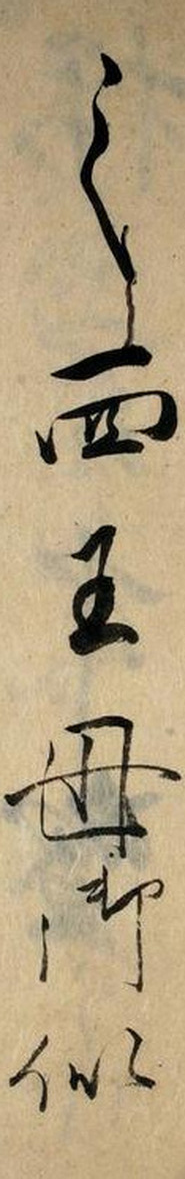之西王母御似
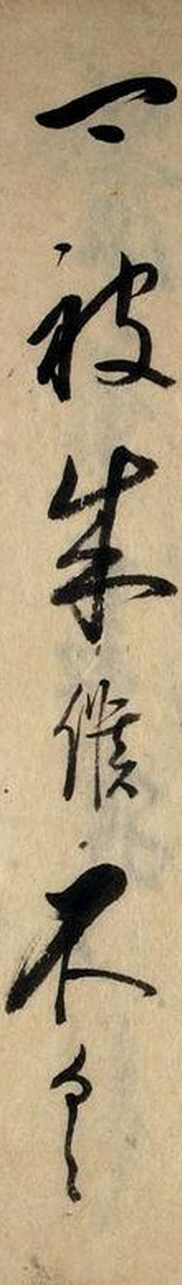可被成候不具

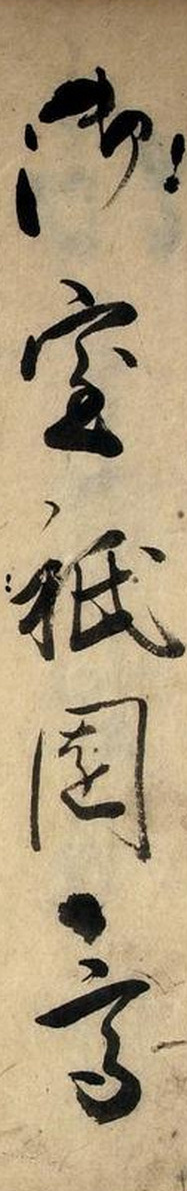御室祇園高
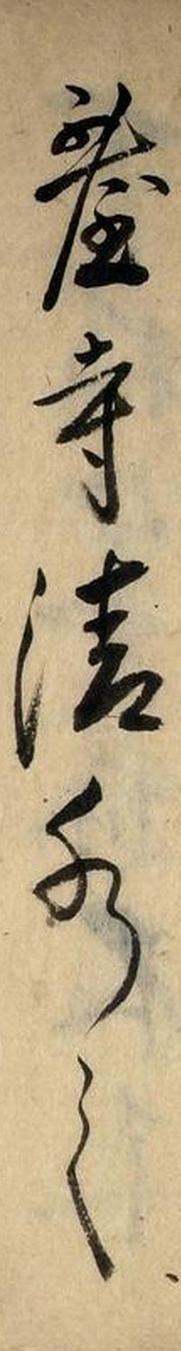台寺清水之
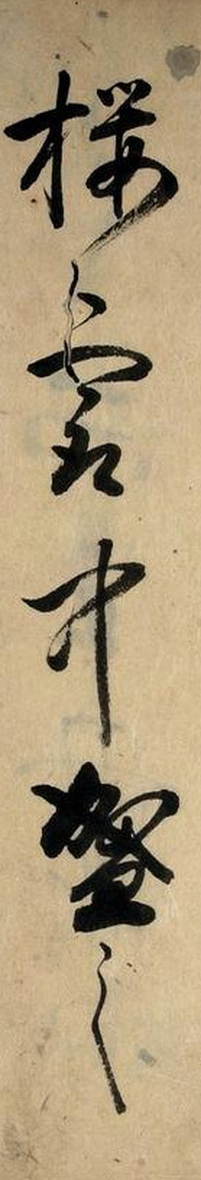桜最中盛之
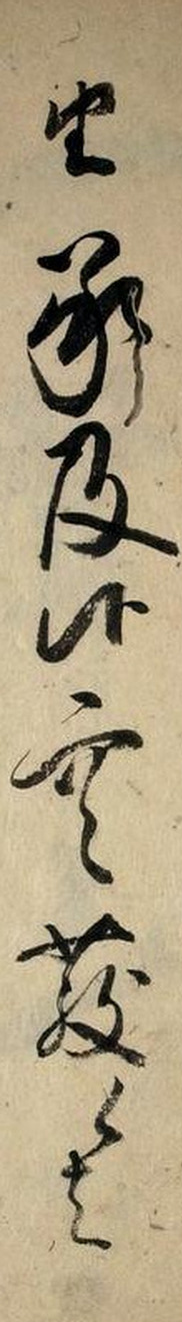由承及候空散候は
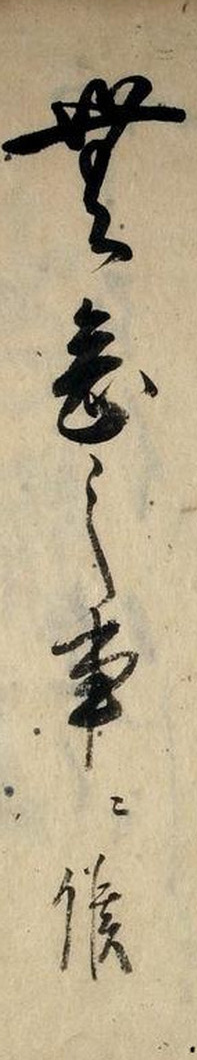無念之事ニ候
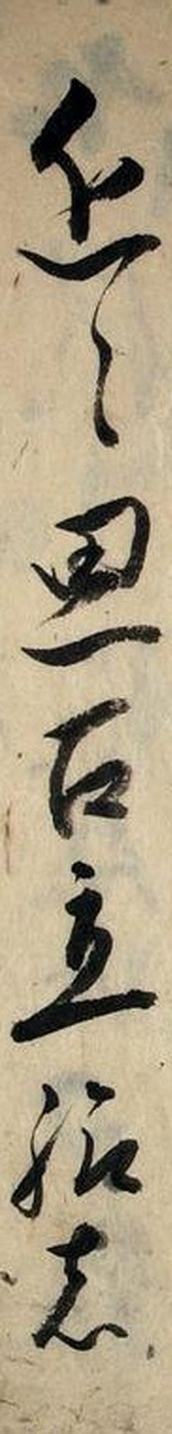近々思召立給は

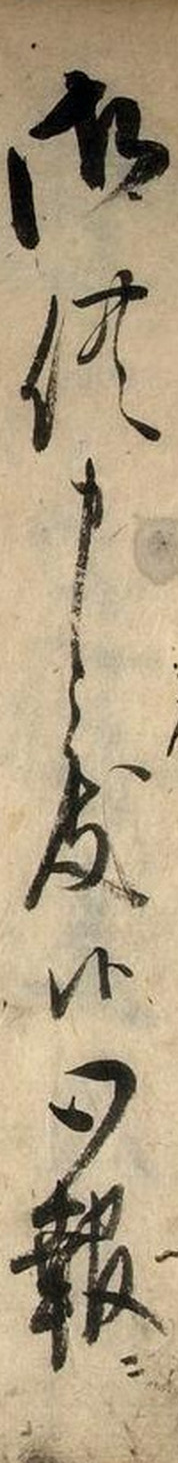御供申上度候御報
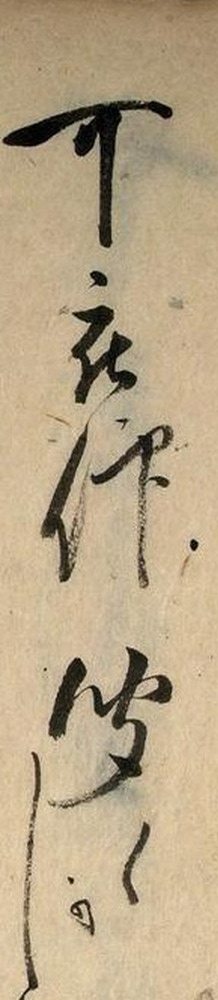可被仰聞候
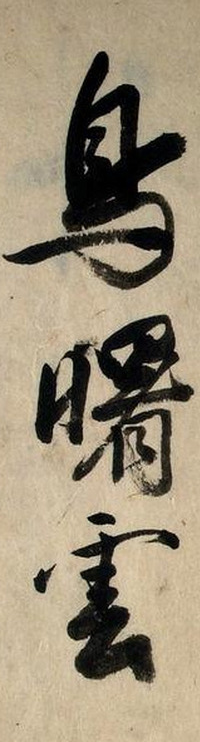鳥曙雲

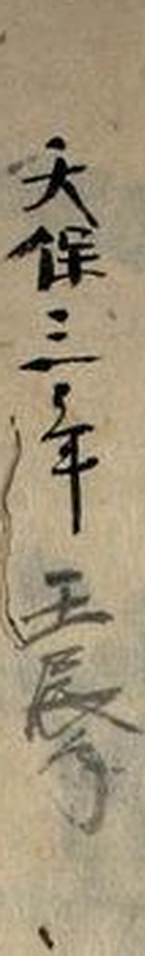天保三年壬辰年
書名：御手本（手習、消息文、和漢朗詠集・論語の一節）
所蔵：福井県文書館 Fukui Prefectural Archives
